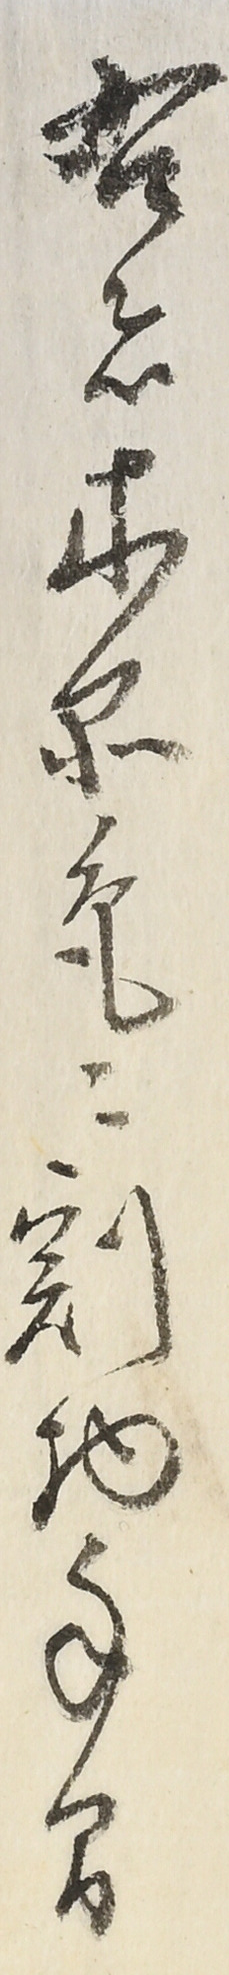右者木品色ニ割物手間
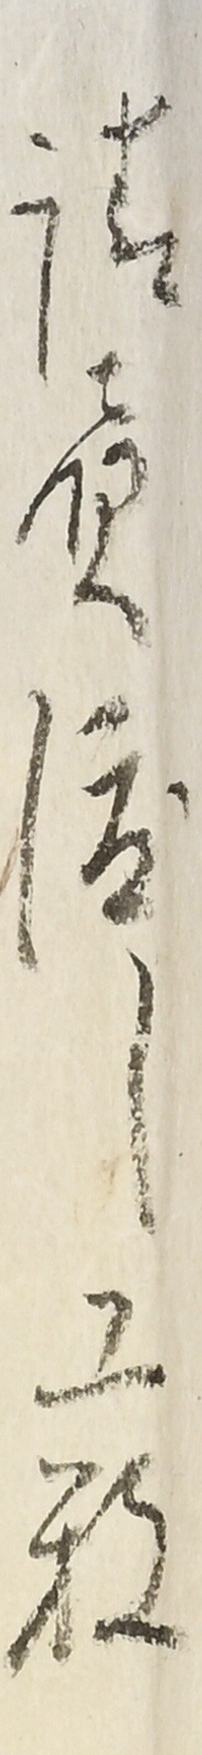請負渡し工数
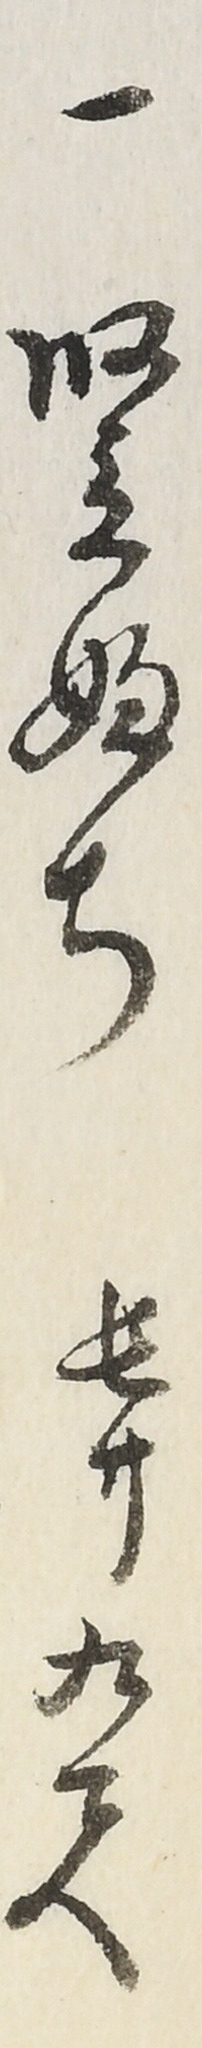一竪ふち長サ九尺
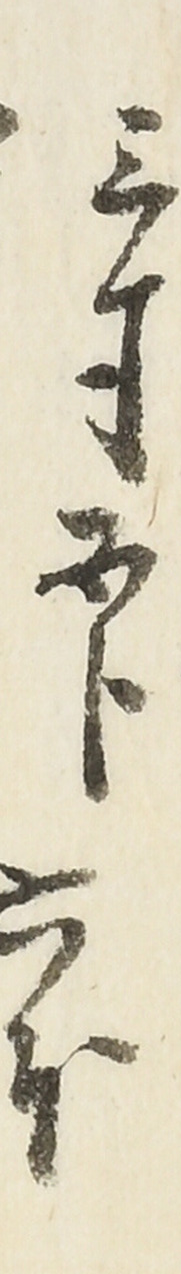三寸五分六本
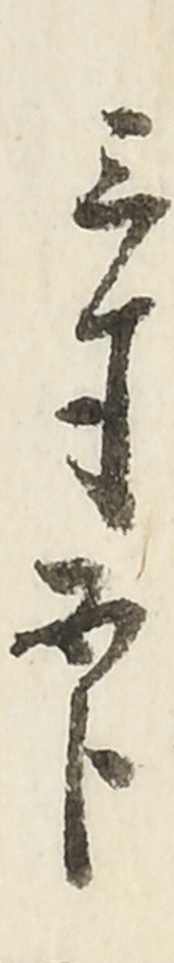三寸五分
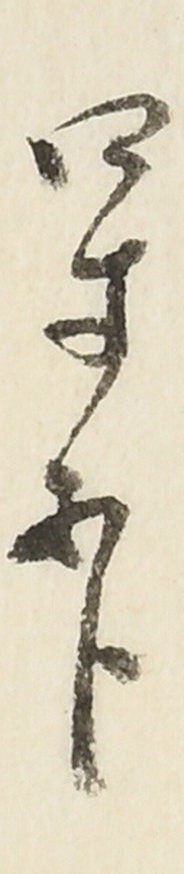四寸五分
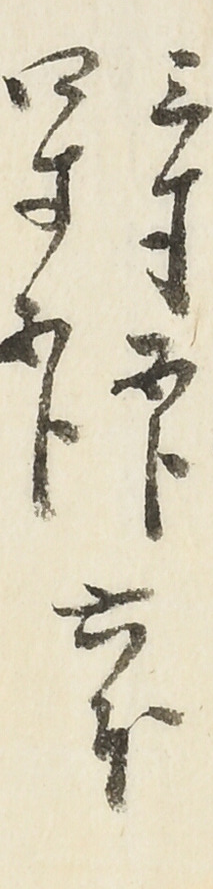三寸五分六本
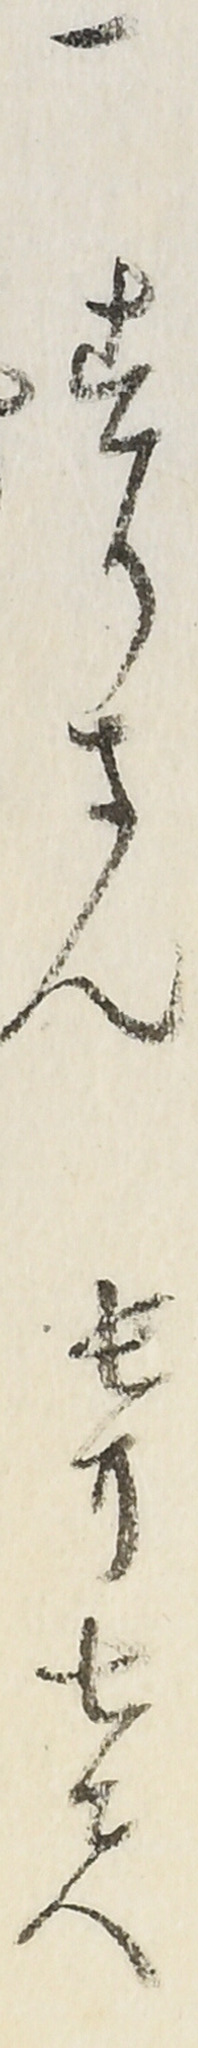一すりさん長サ七尺
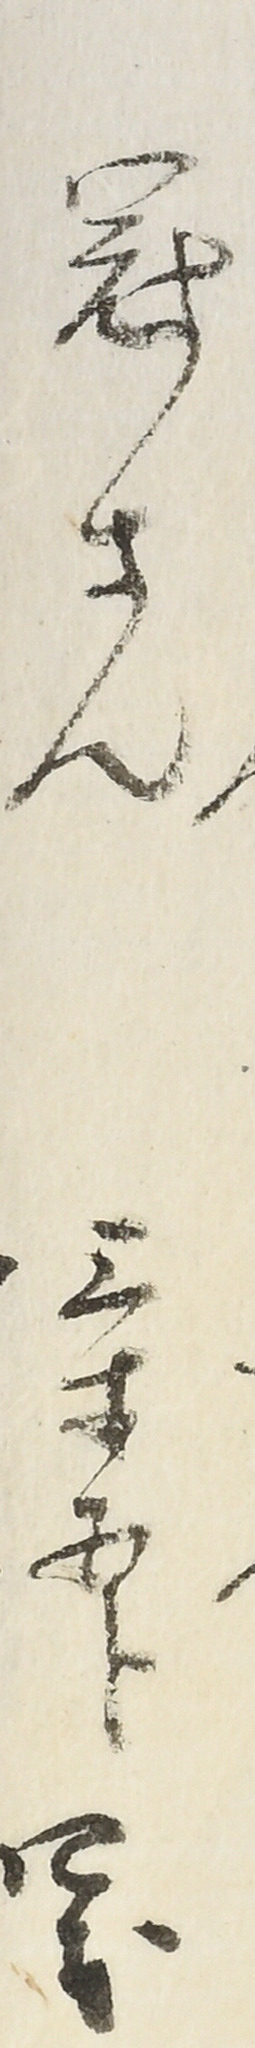冠さん三寸五分四本
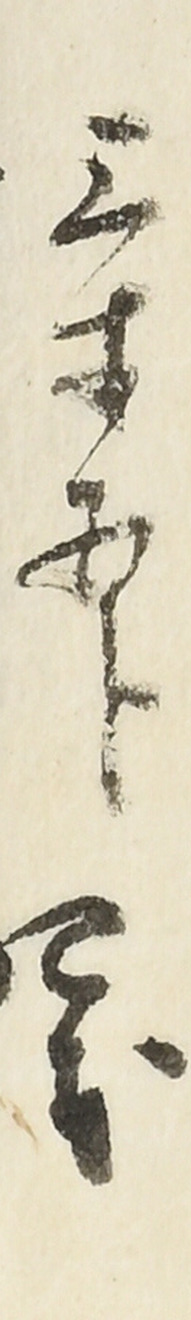三寸五分六本
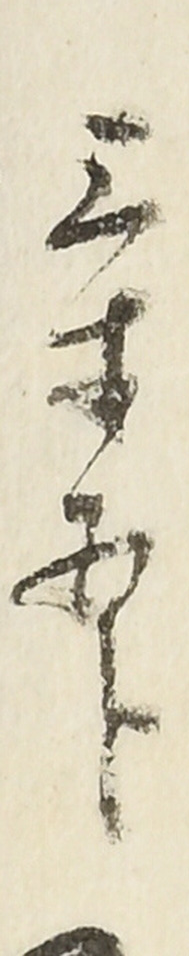三寸五分
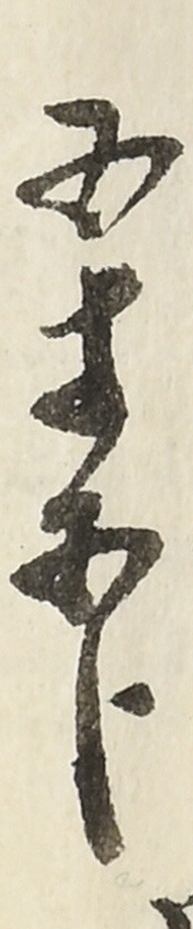五寸五分
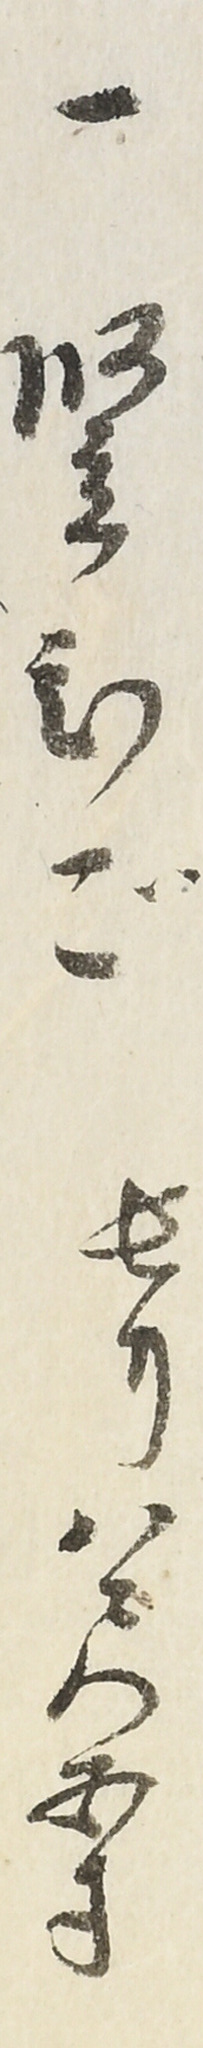一竪ひご長サ八尺五寸
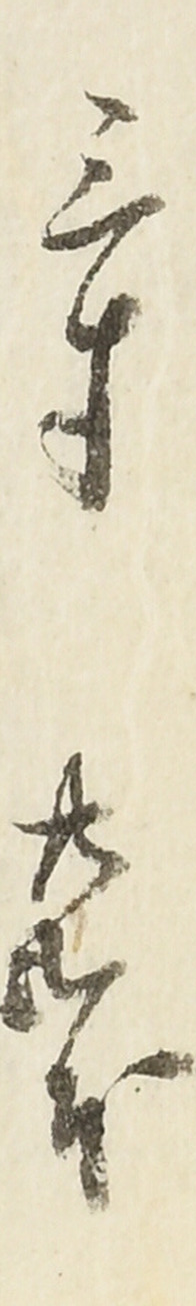三寸廿弐本
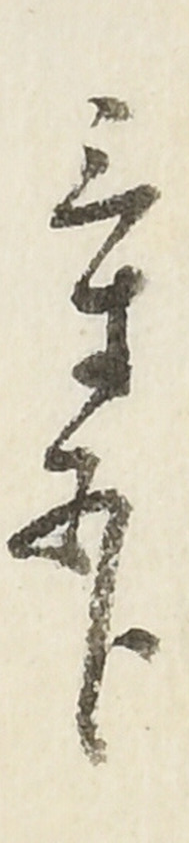三寸五分
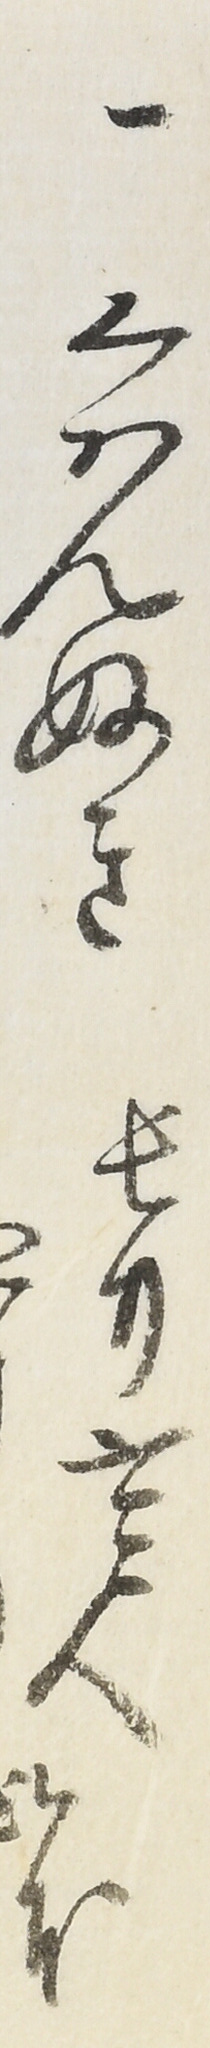一くハんぬき長サ六尺弐本
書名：町方木戸御普請諸事附（一括）
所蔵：伊那市立高遠町図書館・合同会社AMANE
